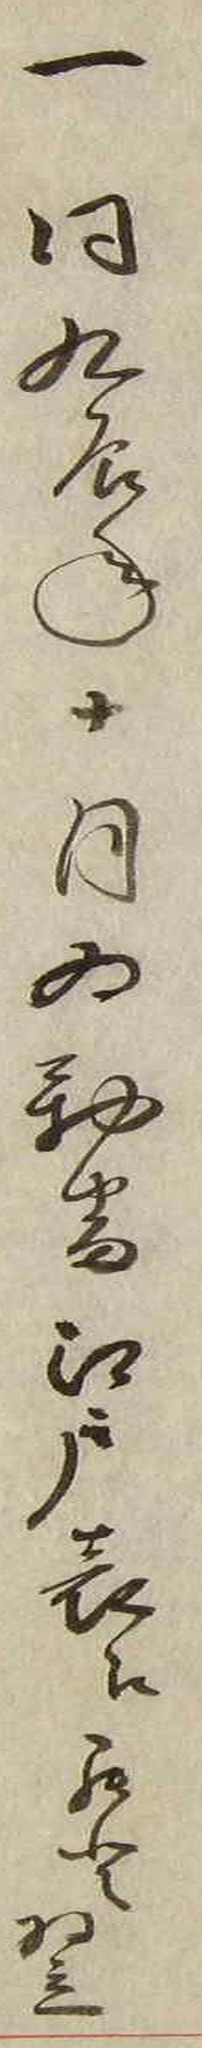一同九辰年十月為勤番江戸表江罷登翌

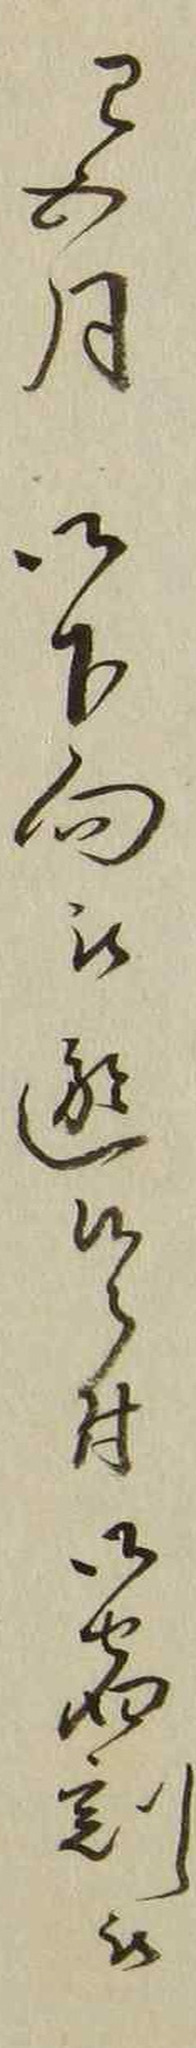巳五月御下向被遊候に付御宿割被
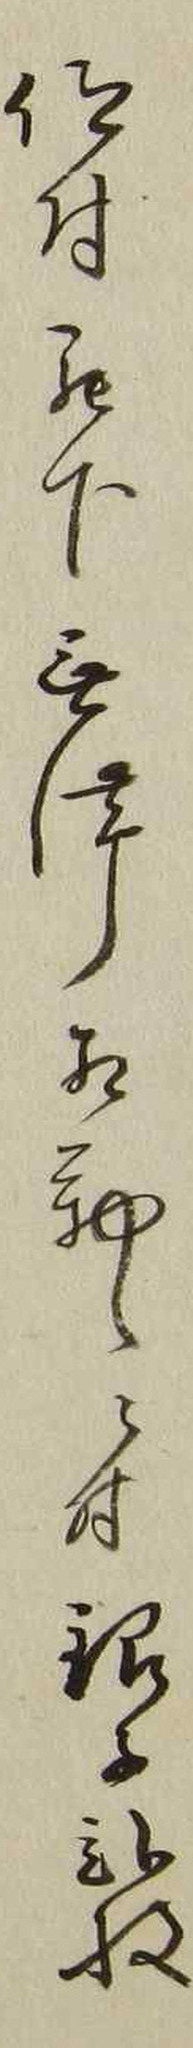仰付罷下無滞相勤候に付銀子弐枚
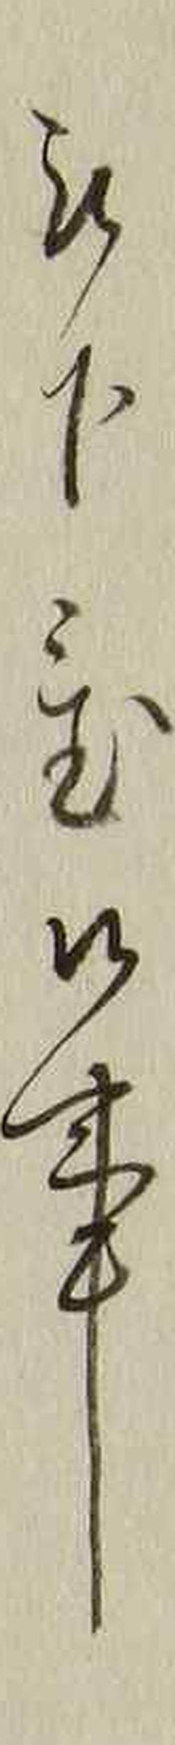被下置候事
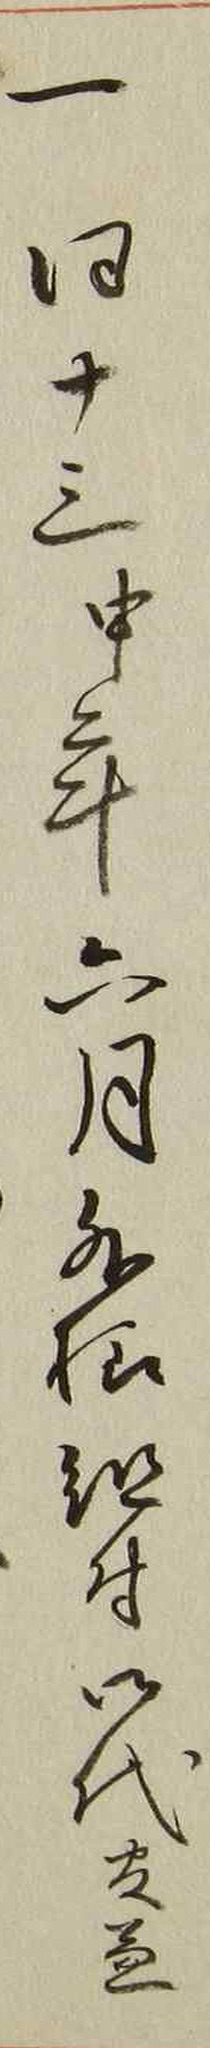一同十三申年六月外様組付御代官兼
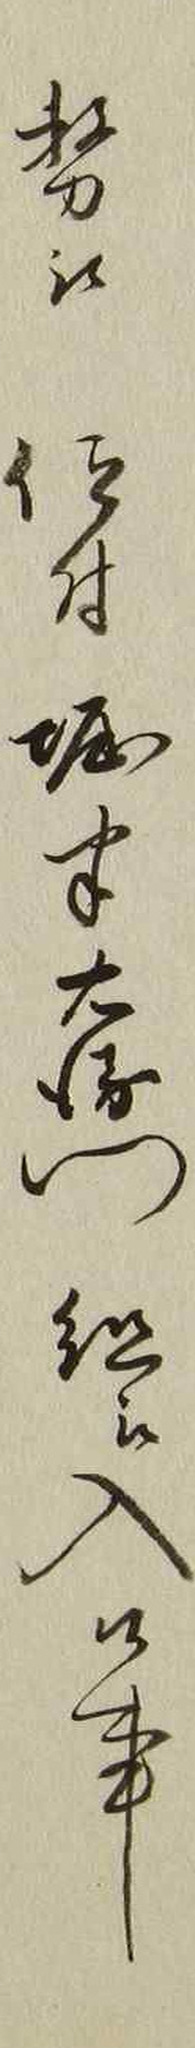務被仰付堀半右衛門組江入候事
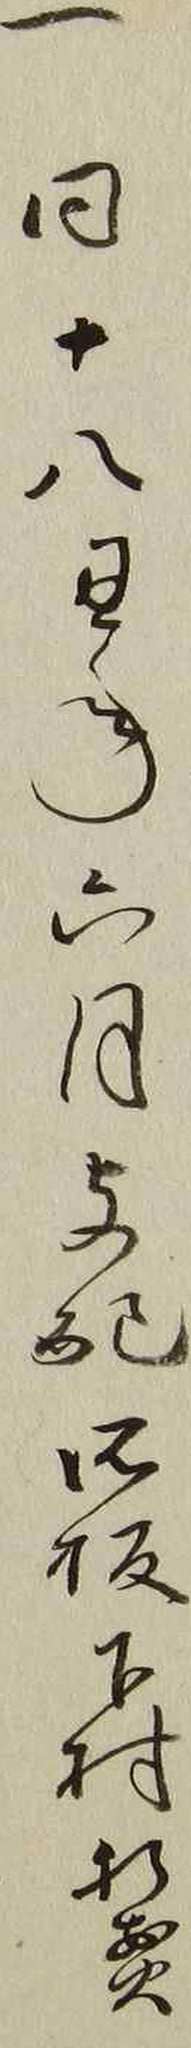一同十八丑年六月支配御板下村折
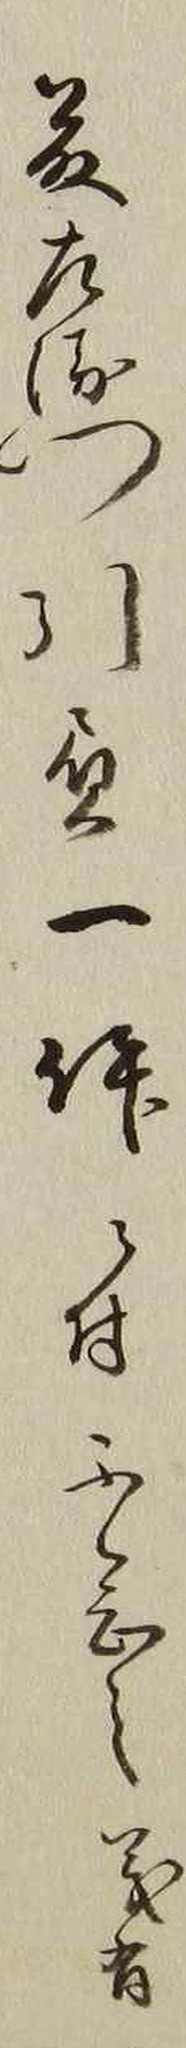藤左衛門引負一件に付不念之義有
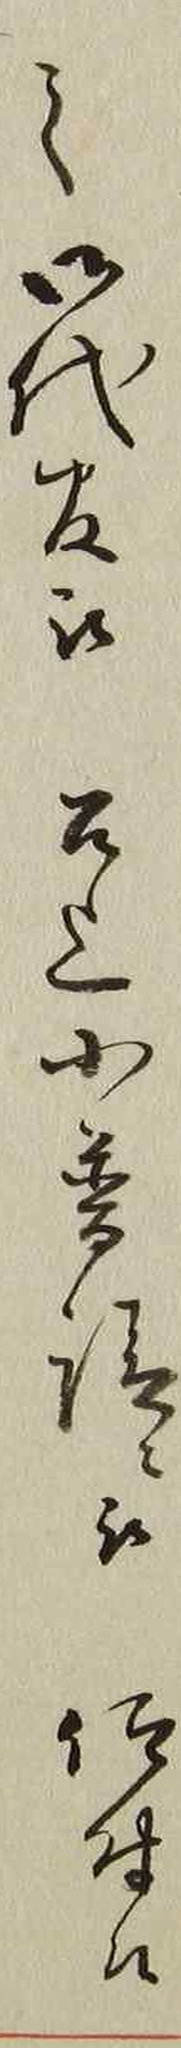之御代官被召上小普請に被仰付候
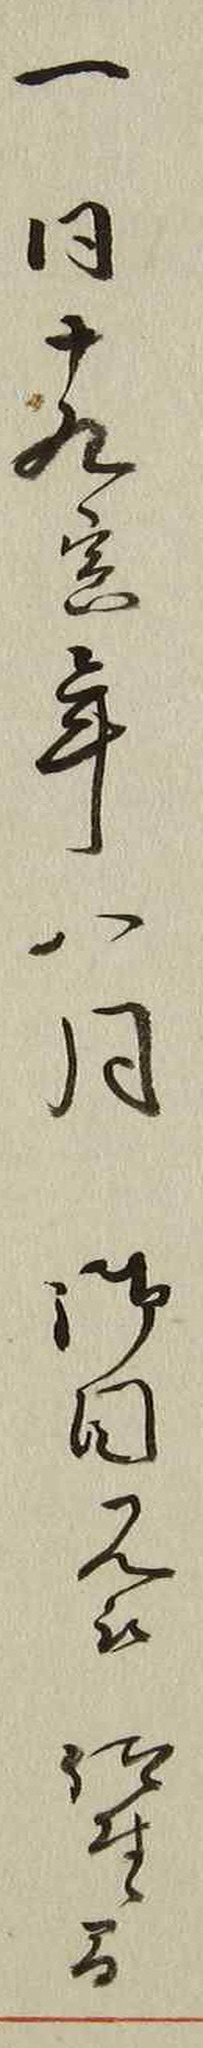一同十九寅年八月御目見被仰付候間
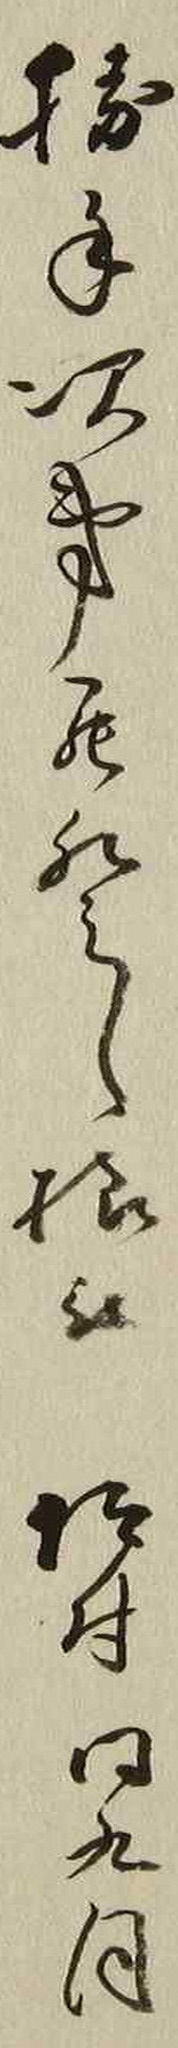勝手次第罷登候様被仰付同九月
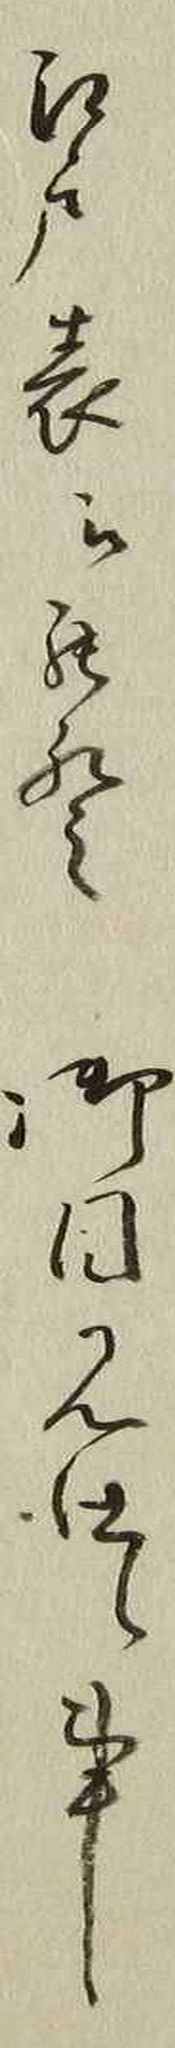江戸表江罷登御目見仕候事
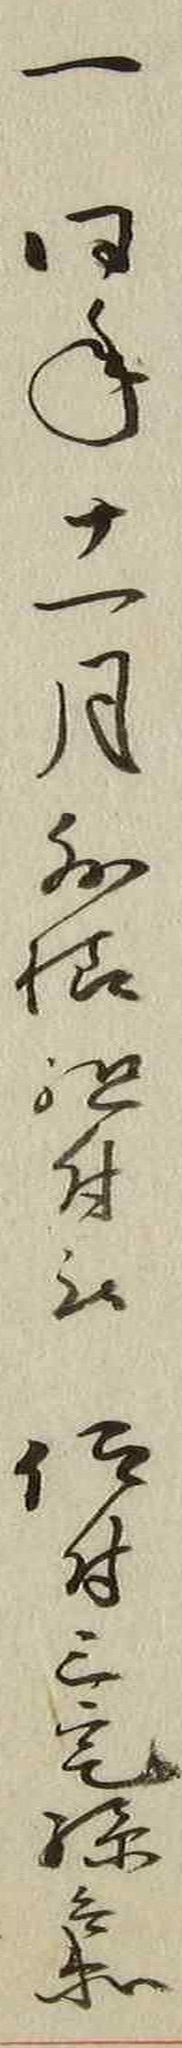一同年十一月外様組付被仰付三宅源兵衛
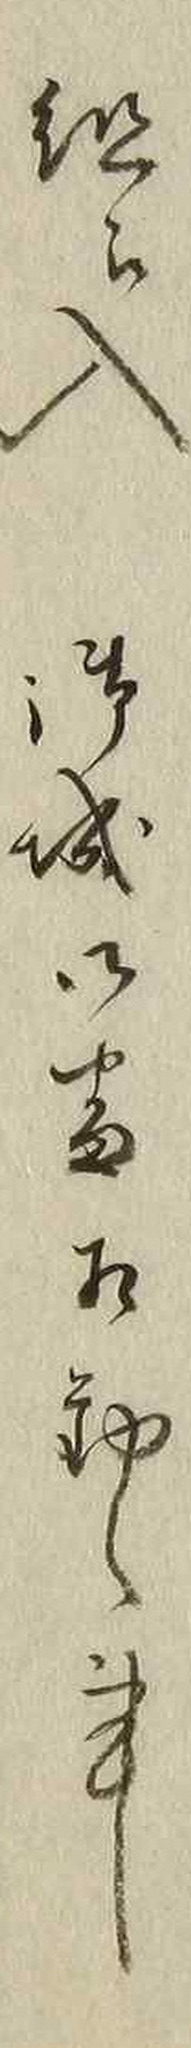組江入御城御番相勤候事
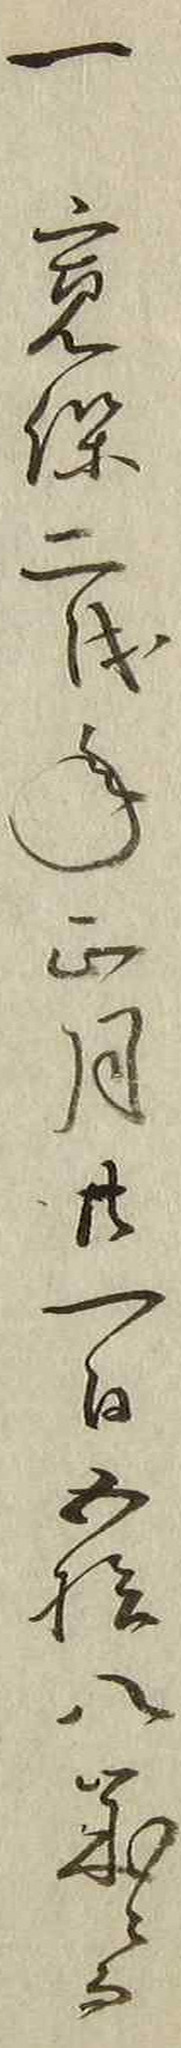一寛保二戌年正月廿一日五拾八歳に而
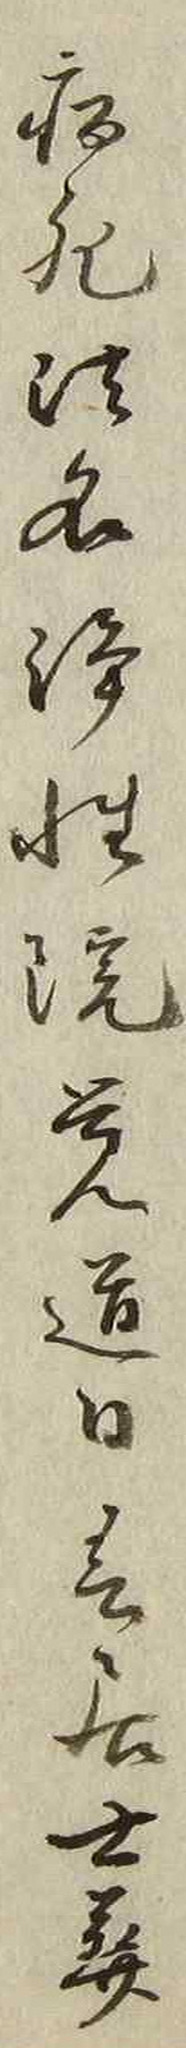病死法名浄性院覚道日言居士葬
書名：諸士系譜　巻之3　い之部3
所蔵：会津若松市立会津図書館
